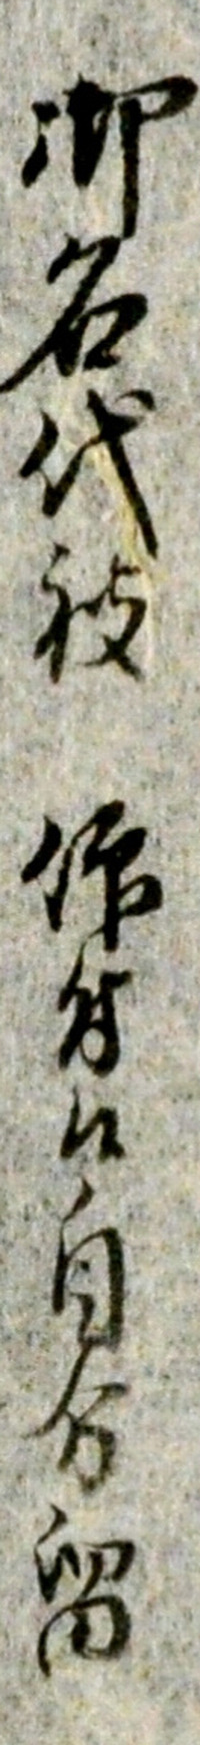御名代被仰付候自分留
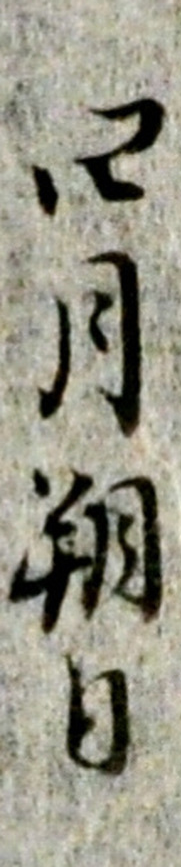四月朔日
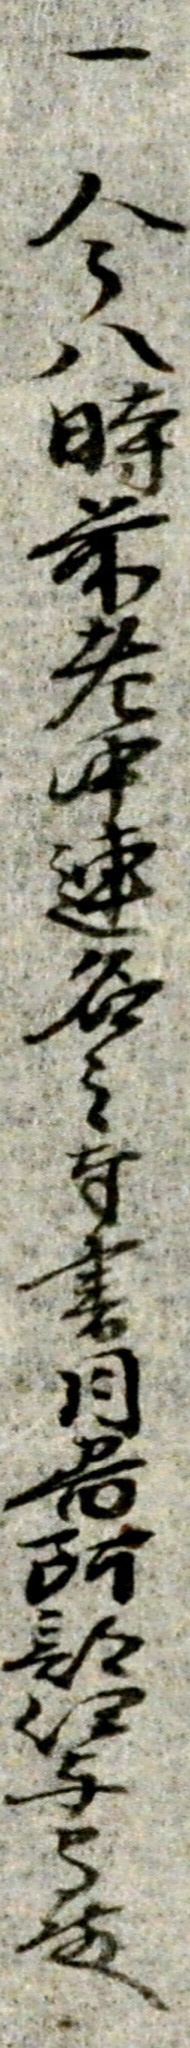一今八時前老中連名之奉書月番阿部伊与守殿
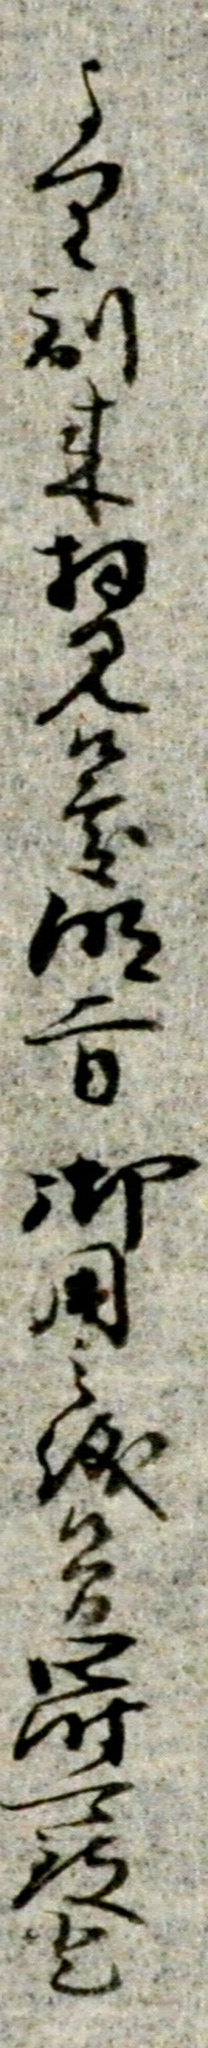より到来拝見候処明二日御用之儀候間四時可致登
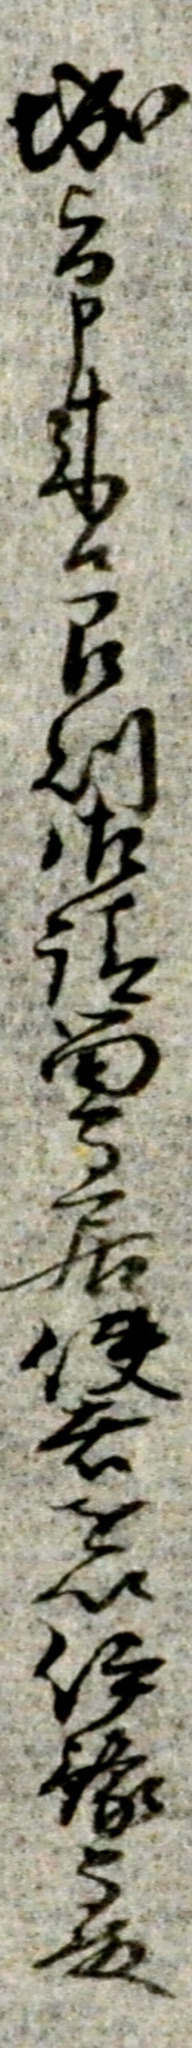城旨申来候即刻御請留守居使者を以伊予守殿
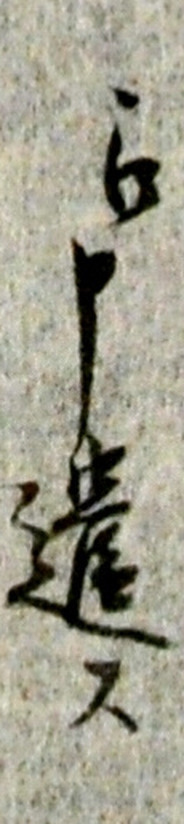江申遣ス
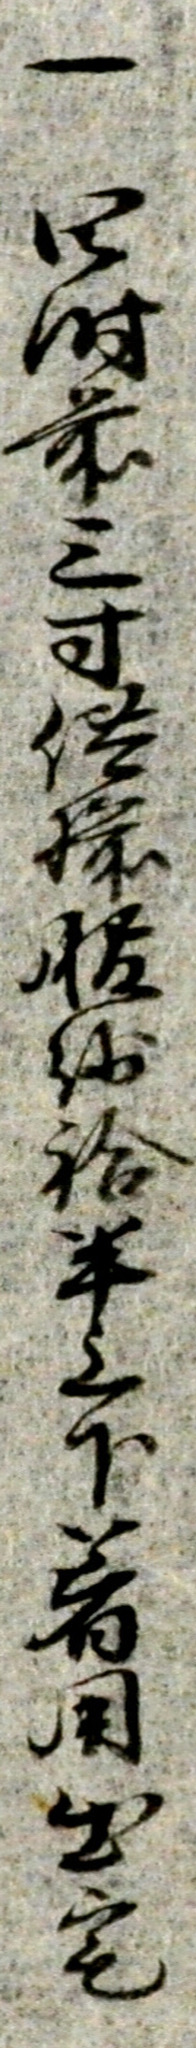一四時前三寸供揃服紗袷半上下着用出宅
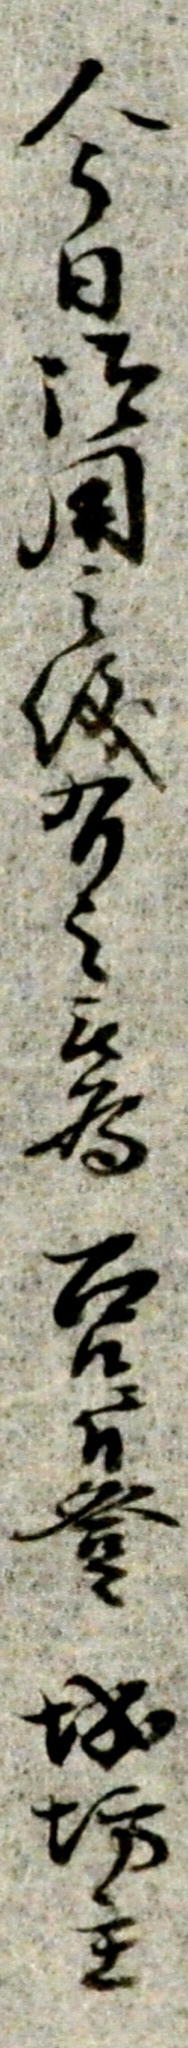今日御用之儀有之被為召候ニ付登城坊主
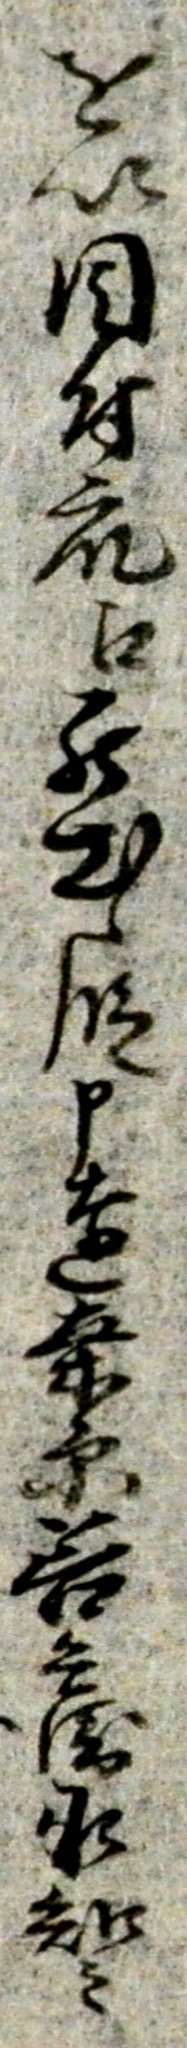を以目付衆江罷出候段申達桑原善兵衛承知と
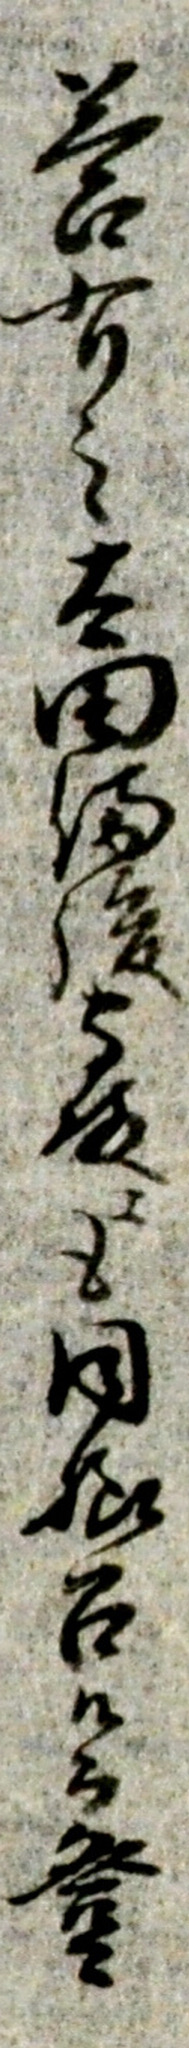答有之太田備後守殿ニも同様召候而登
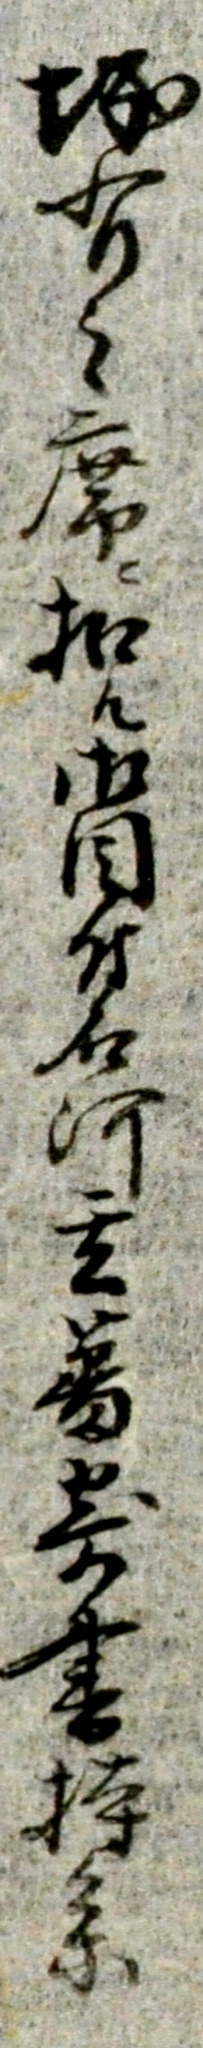城有之席ニ扣ル御目付石河玄蕃寄書持参

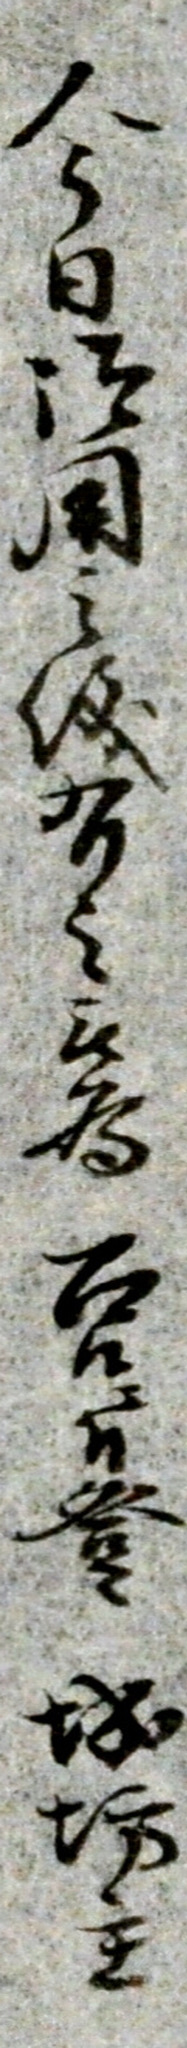今日御用之儀有之被為召候ニ付登城坊主
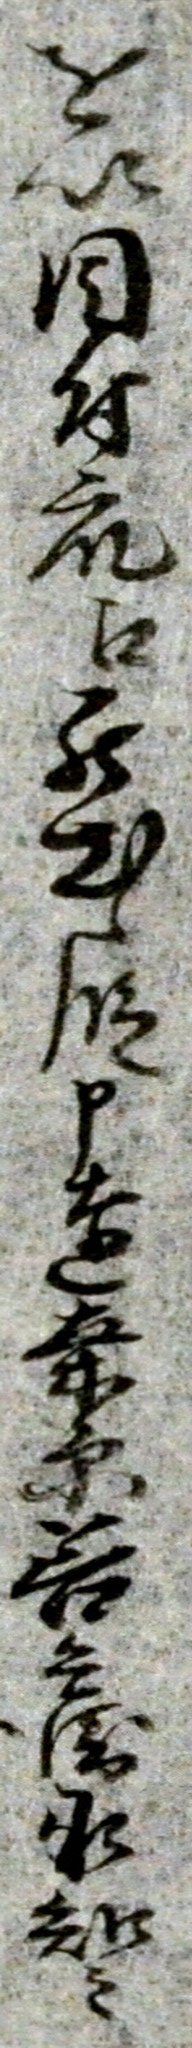を以目付衆江罷出候段申置桑原善兵衛承知之
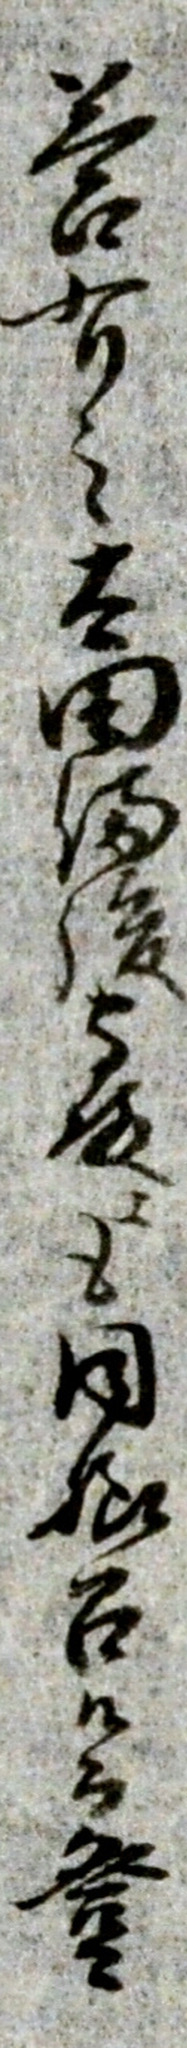答有之太田備後守殿ニも同様召候而登
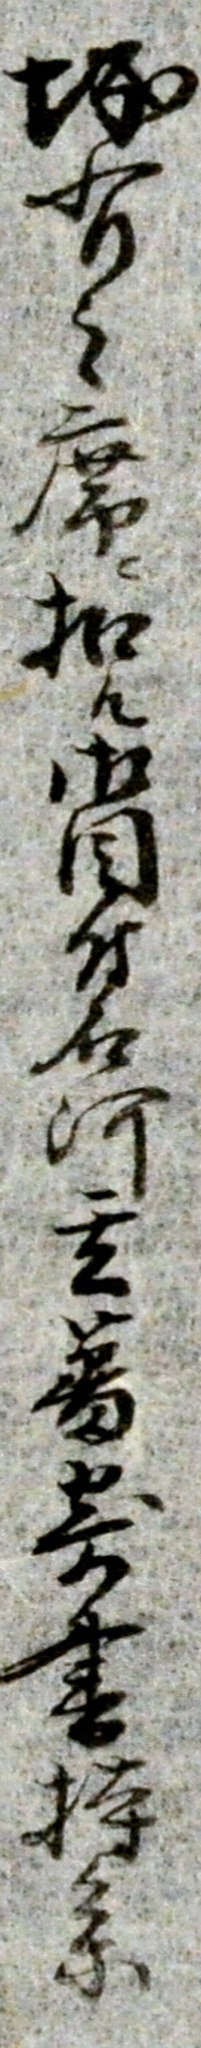城有之席ニ控ㇽ御目付石河玄蕃寄書持参
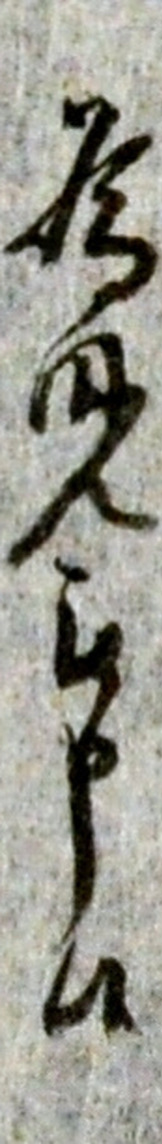為見被申候
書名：日光御名代相勤候節ノ留
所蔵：伊那市立高遠町図書館・合同会社AMANE
